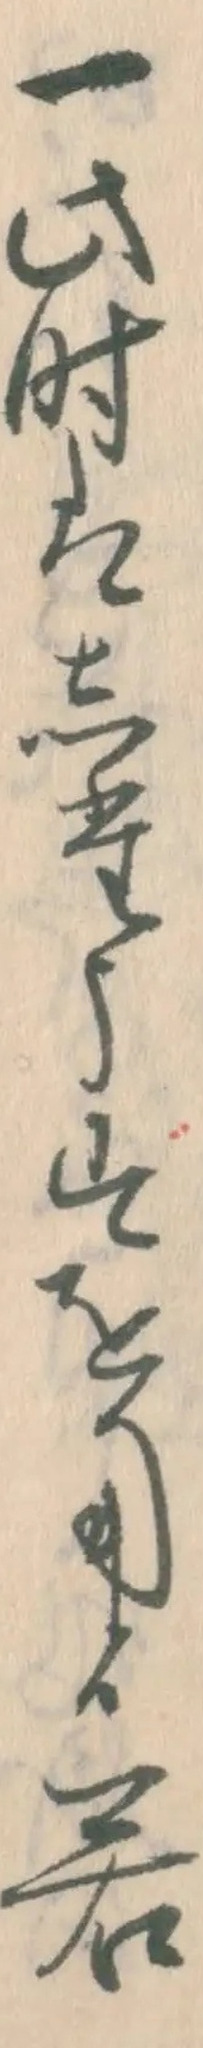一此時はしたうずを用候若
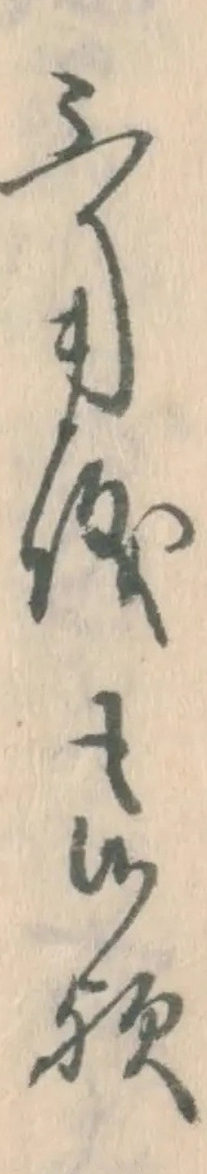不要儀も候歟
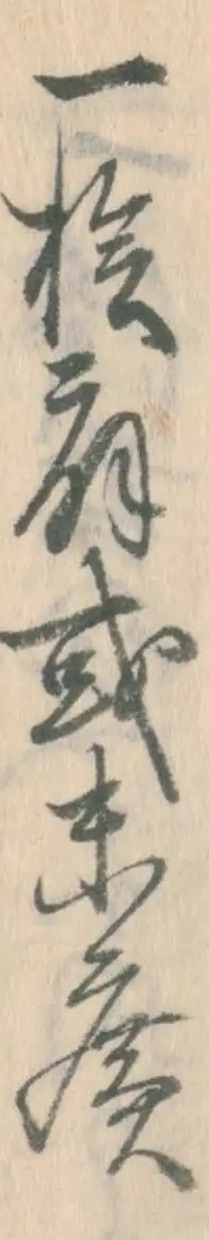一桧扇或末広
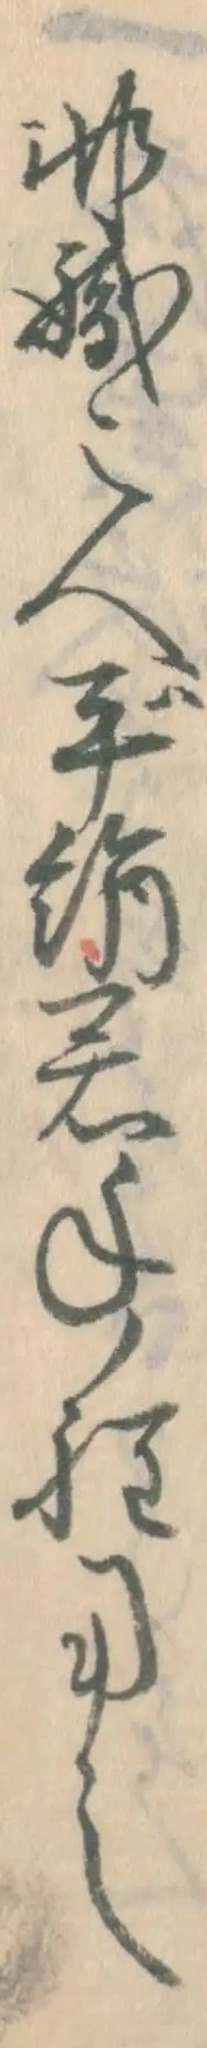非職之人ハ平絹・若年ノ程用之

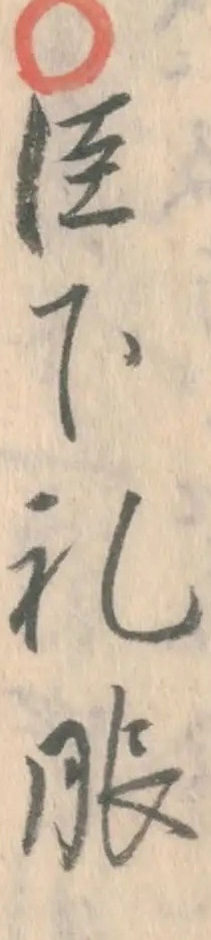〇臣下礼服
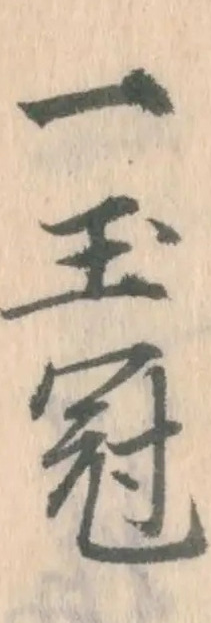一王冠
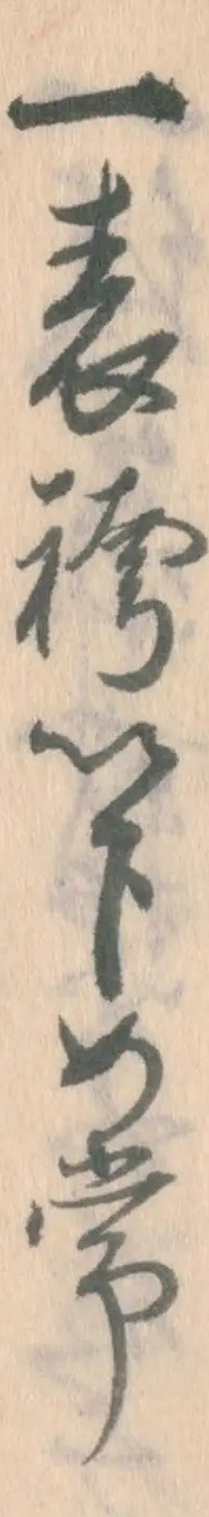一表袴以下如常
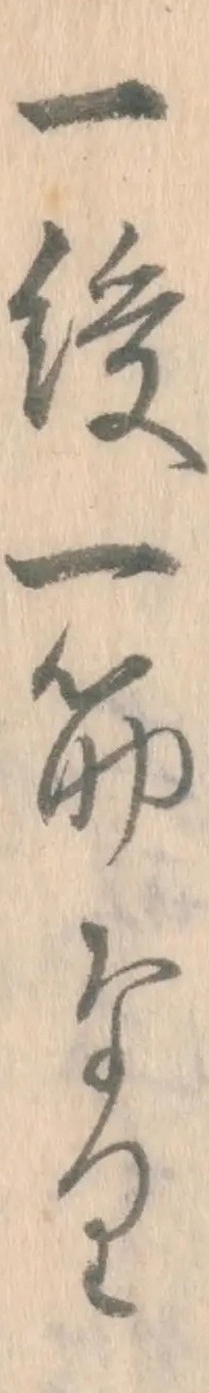一綬一筋なり
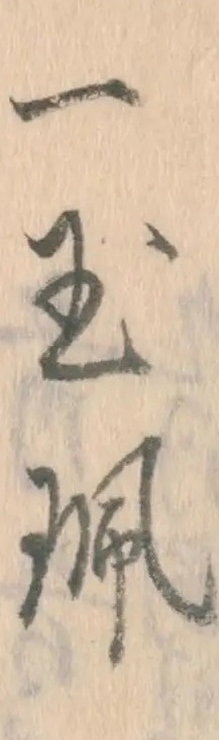一玉珮
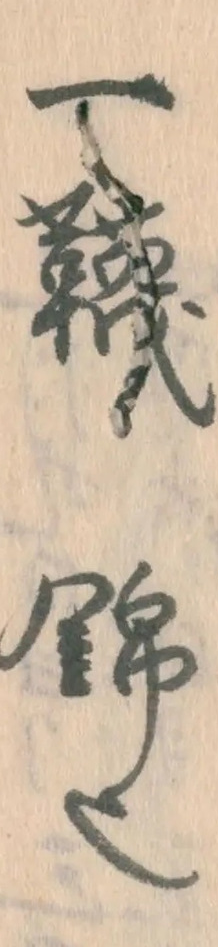一韈錦也
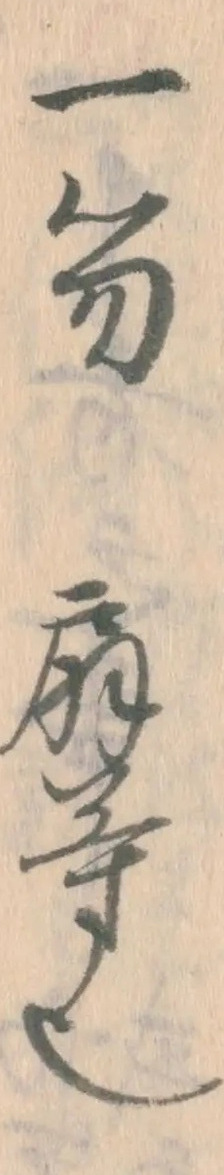一笏扇等也
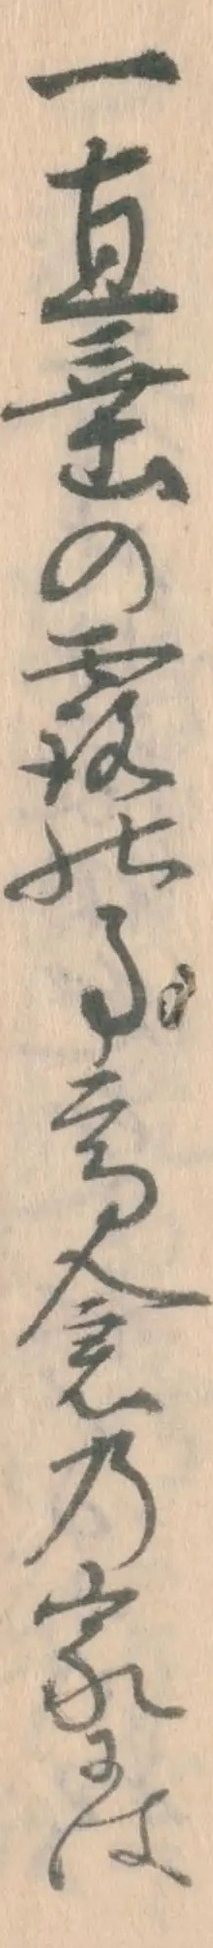一直垂の露の事高倉の家には
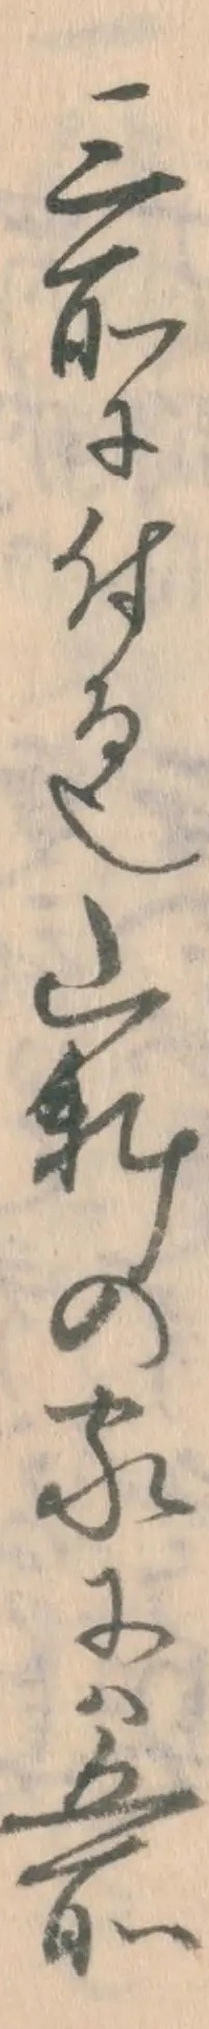三所に付る也山科の家には五所
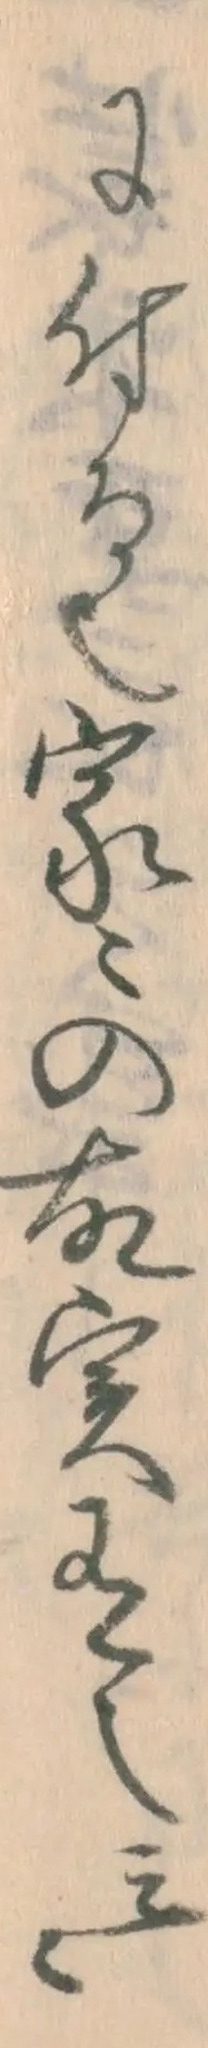に付る也家々の故実有之云々
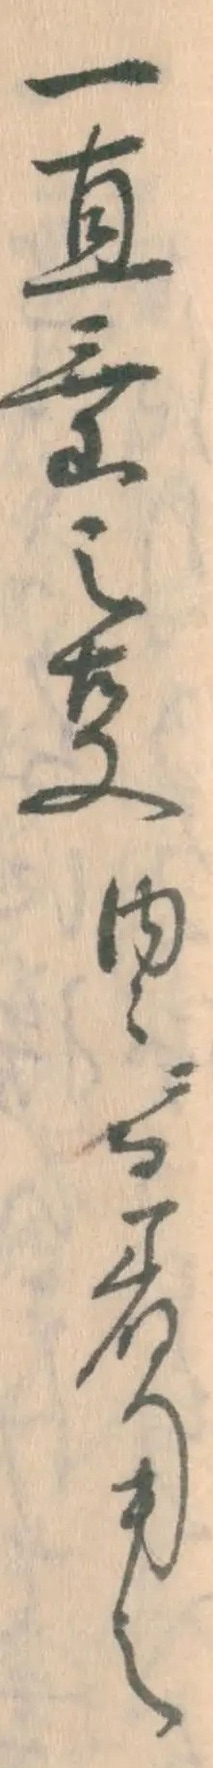一直垂之事内々ニ而着用之
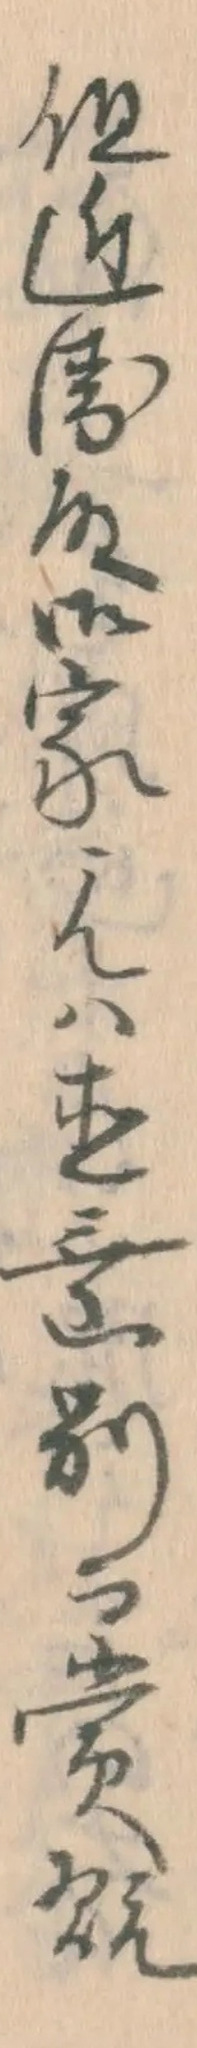但近衛殿御家ニてハ直垂別而賞翫
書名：賀茂社記録. 第80冊
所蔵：国立国会図書館 National Diet Library, JAPAN
